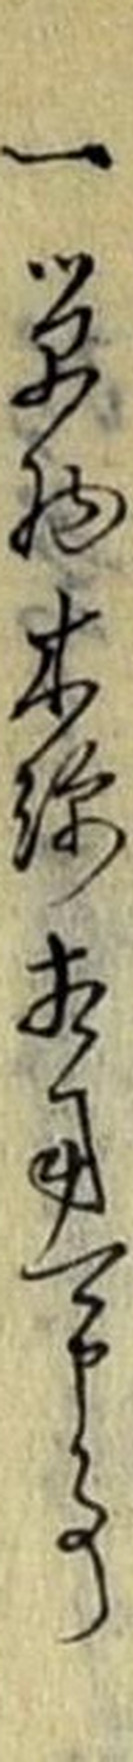一単物木綿相用可申事
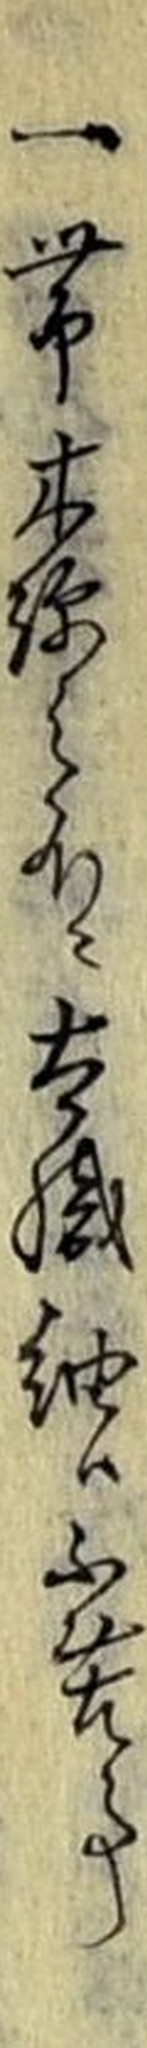一帯木綿之外に太織紬は不苦事
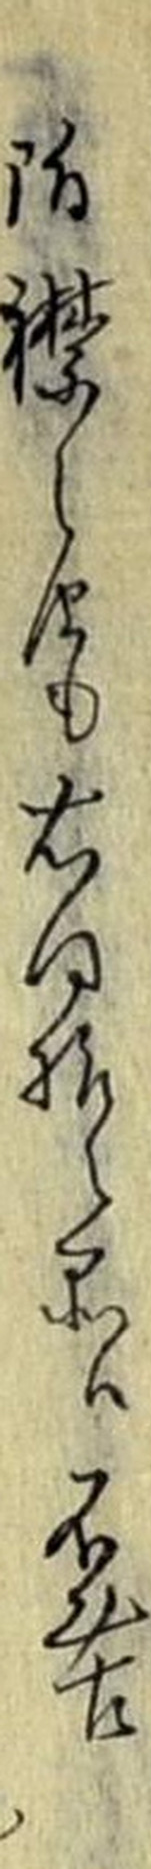附襟之儀も右同様之品は不苦
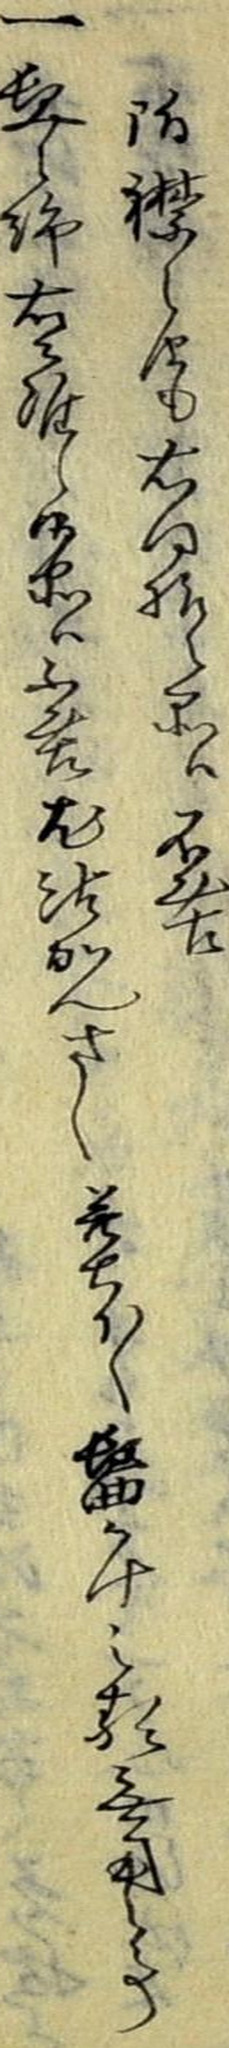一髪之飾右に准し候品は不苦尤銀かんさし井ちり〳〵髷かけ之類無用之事
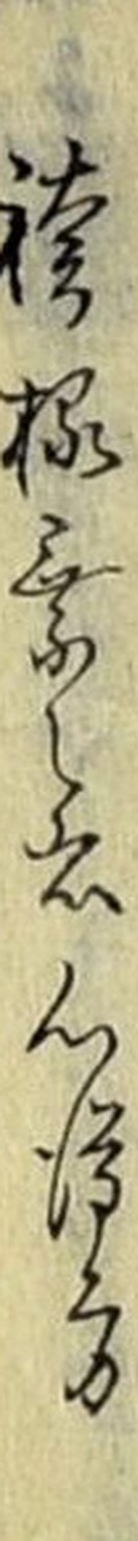袴椽乗之者心得方
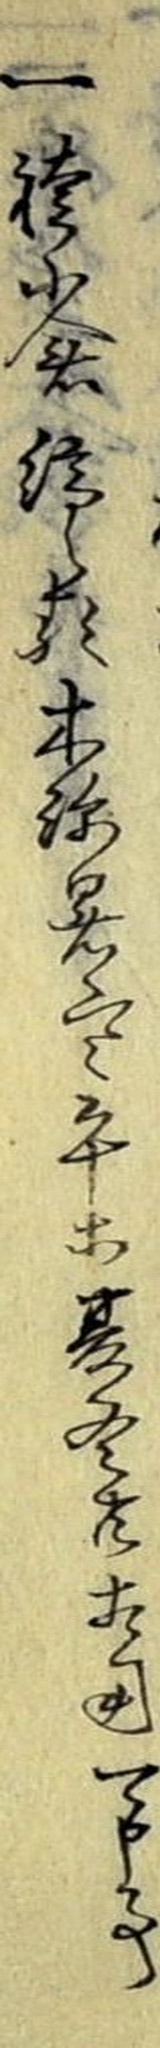一袴小倉縞之類木綿暑寒午等夏冬共相用可申事
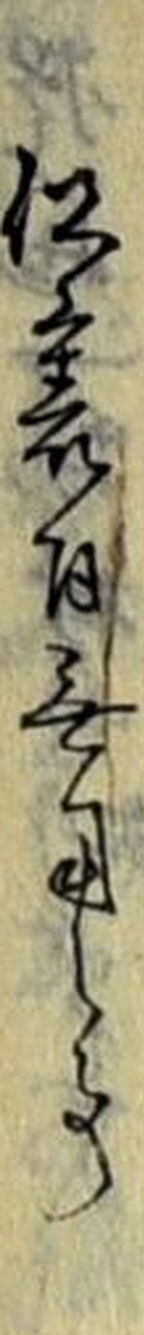但裏付無用之事
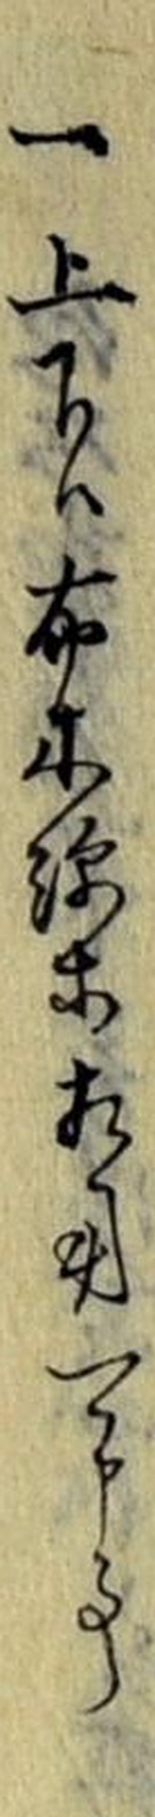一上下は布木綿等相用可申事

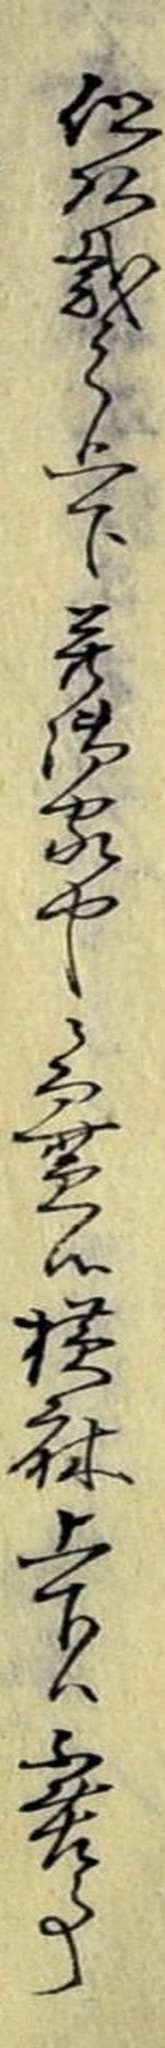但頂戴之上下井御家中に而貰候横麻上下は不苦事
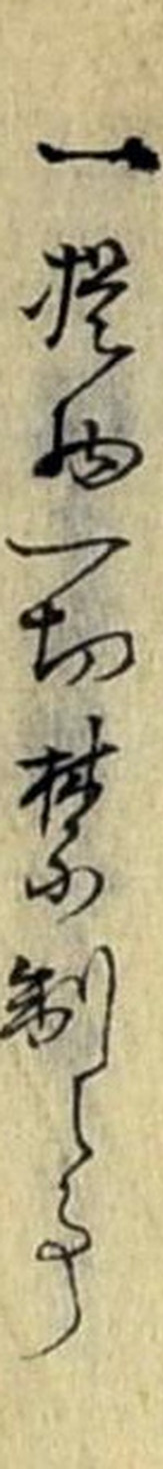一提物一切禁制之事
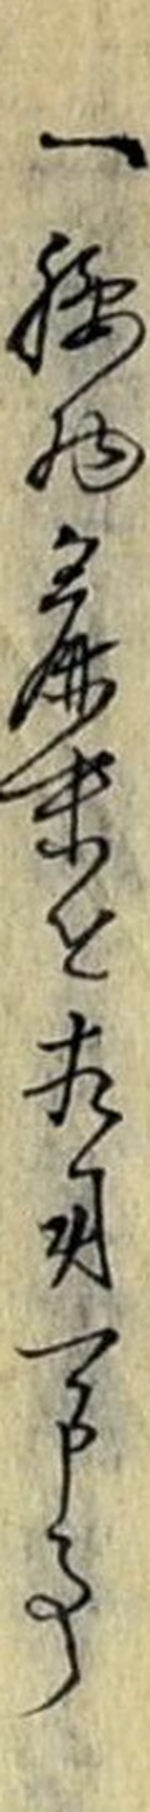一腰物麁末を相用可申事
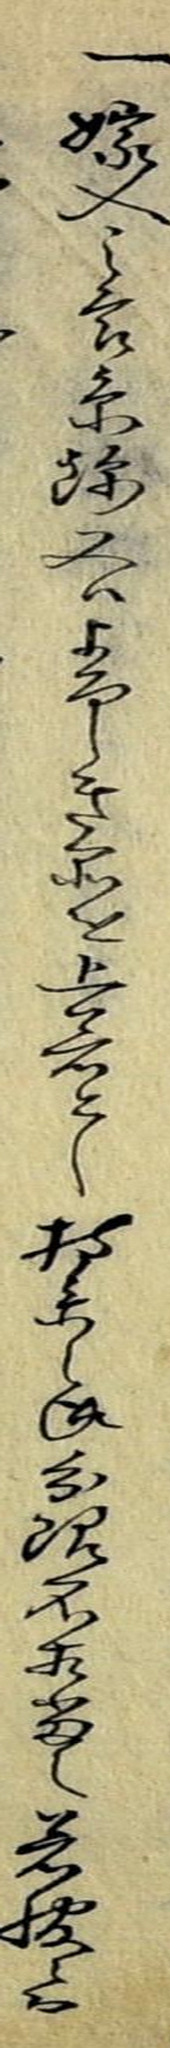一嫁入之節糸綿又はよろしき品を上着とし持参之趣分限不相当之着服に而
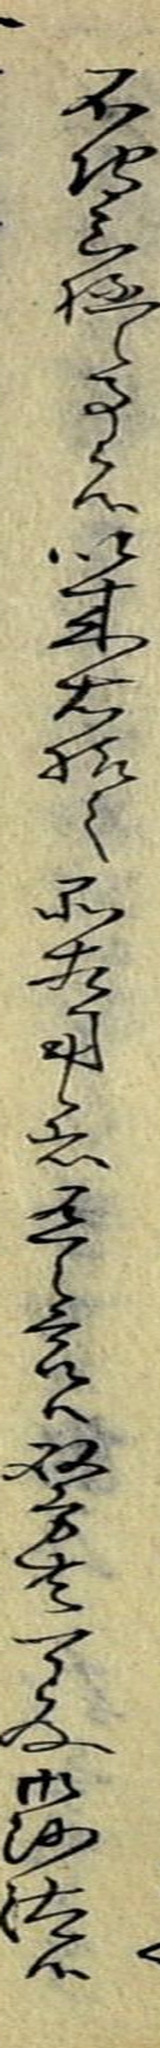不埒至極之事に候以來右様之品相用候者有之節は双方共可被及御沙汰候
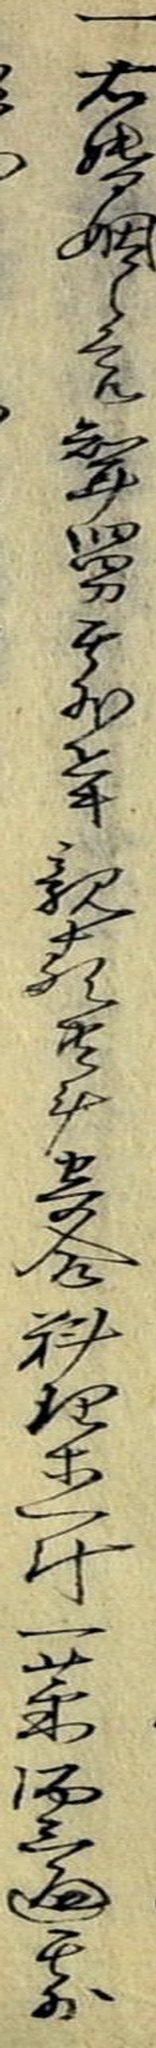一右婚姻之節聟舅其外近キ親類共斗寄合料理等一汁一菜酒三辺其外
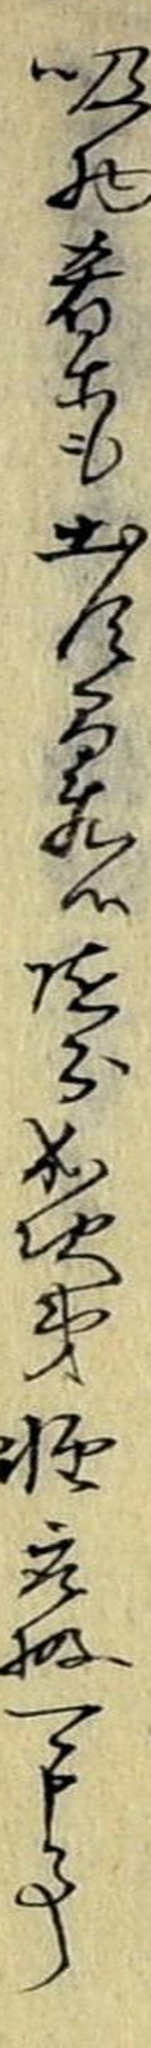吸物肴等も出す間敷候随分成次第軽取扱可申事
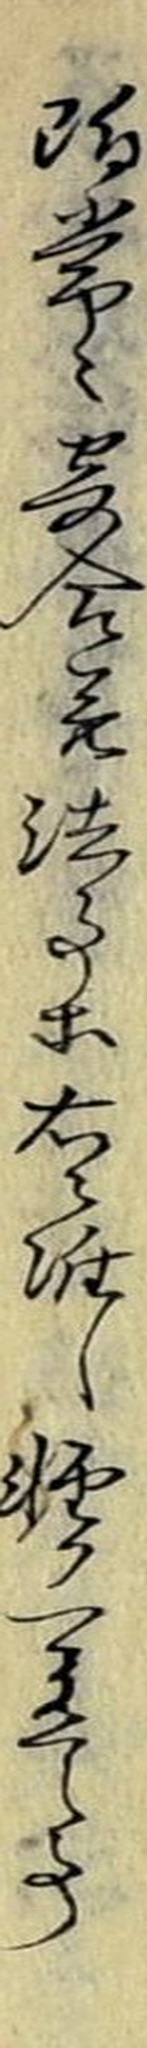附常々寄合井法事等右に准し軽ク可有之事
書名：命令之部 六
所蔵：福井県文書館 Fukui Prefectural Archives
